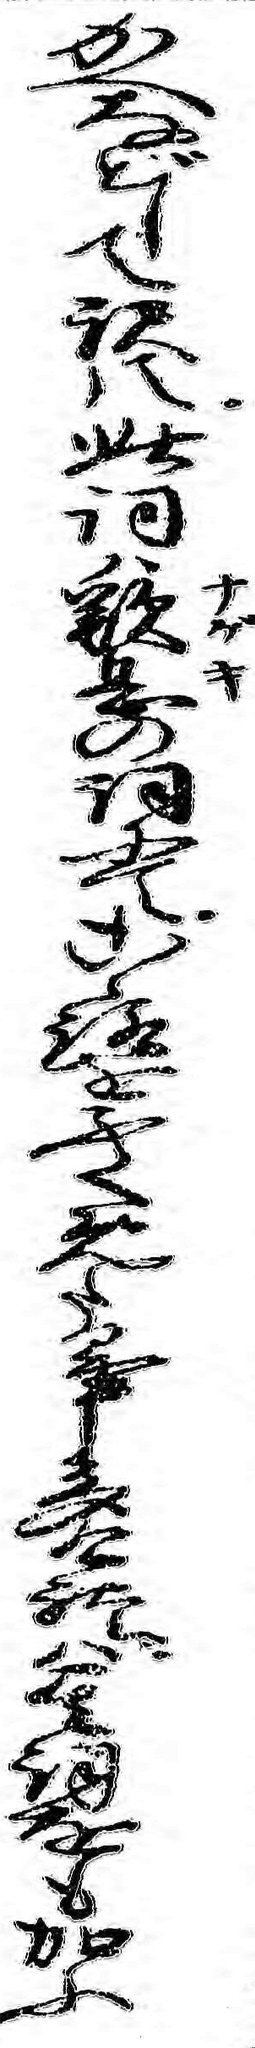かへなどして訳す。此詞は歎息の詞にて。こゝろをふくめたる事多けれは。其詞をも加ふ
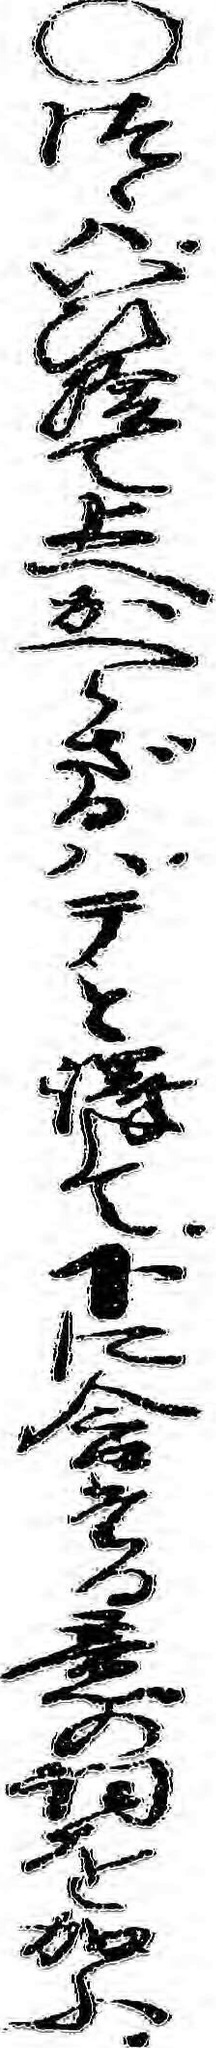◯つゝはいひ続て上へかへらざるは。テと訳して。下に含たる意の詞を加ふ。
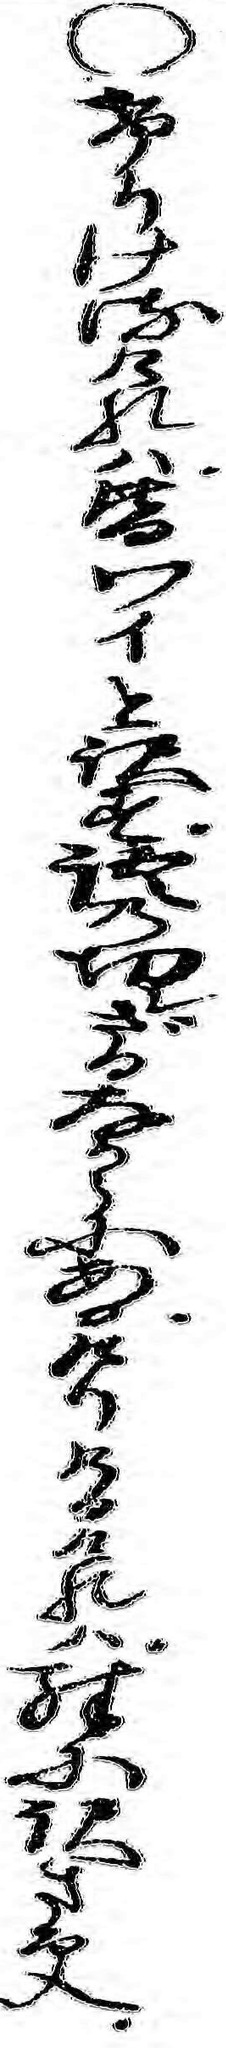◯けりけるけれは皆ワイと訳す。語の切レざるなからにある。けりけるけれは。殊に訳さず。
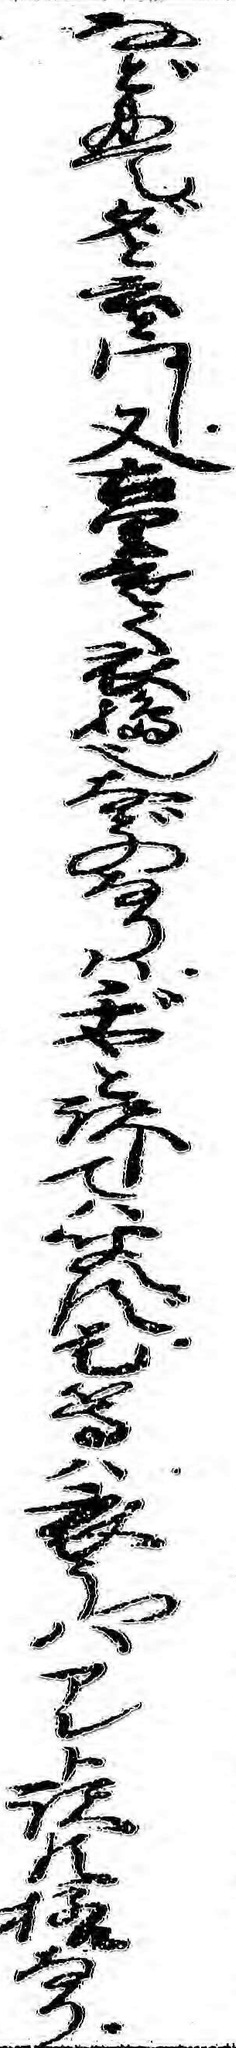などにてダと云と同し。又古里寒く衣搗也などのなりはヂヤと訳しては聞えず。是等は衣うつはアレト訳す様なり。
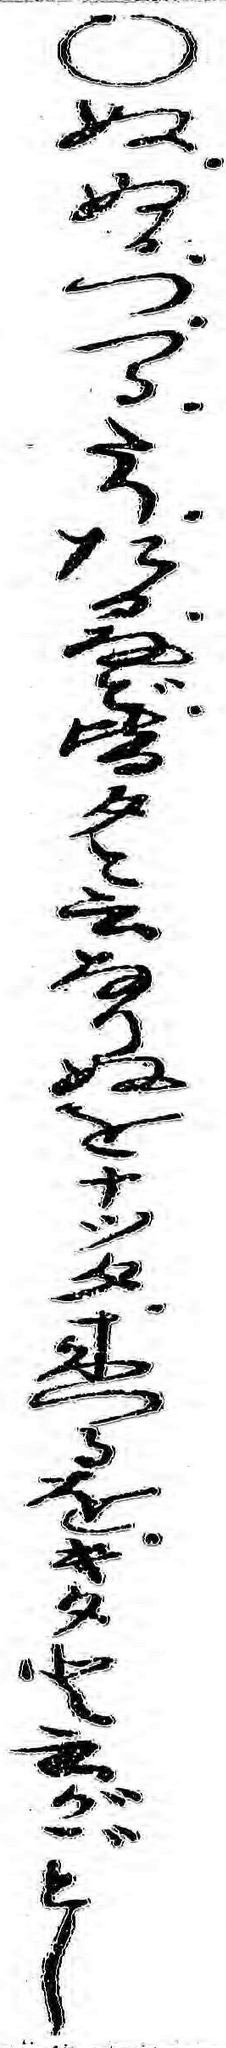◯ぬ。ぬる。つ。つる。たり。たる。など。皆タと云なりぬをナツタ。来つるを。キタと云がごとし
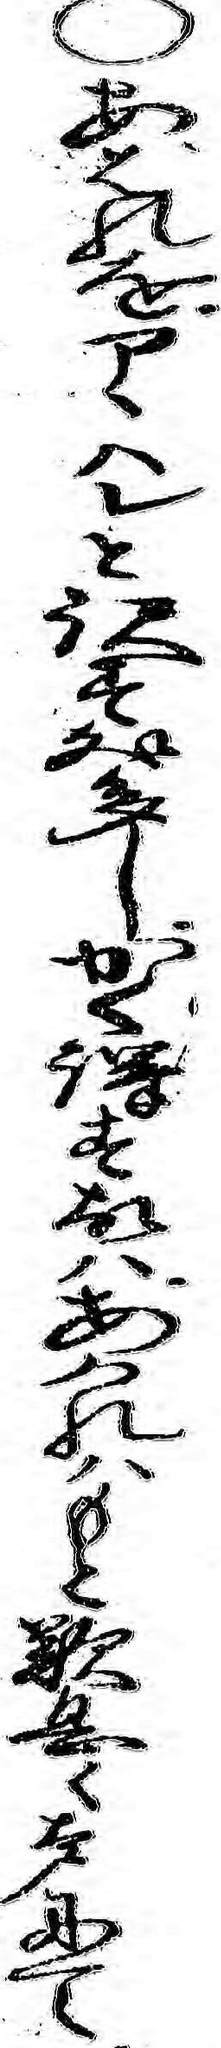◯あはれを。アゝハレと訳す処多し。かく訳す故は。あはれはもと歎息く声にて。
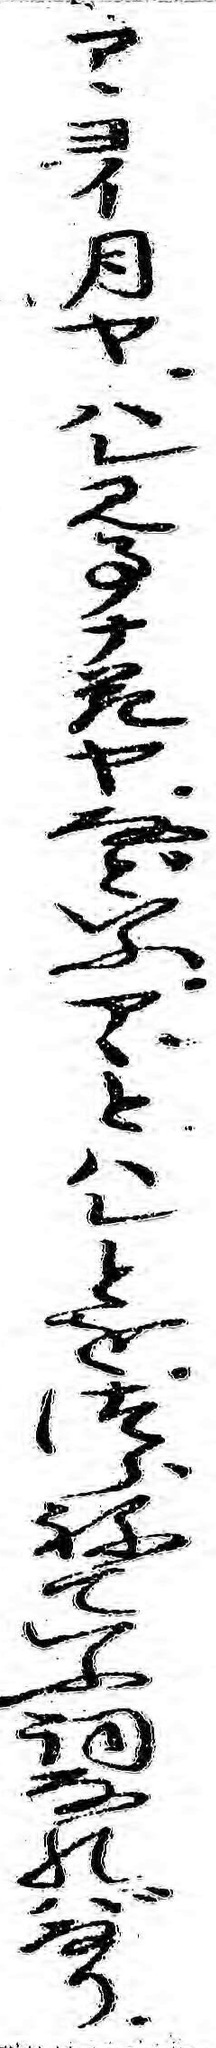アゝヨイ月ヤ。ハレ見事ナ花ヤ。などいふ。アゝとハレとを。つらねていふ詞なればなり。

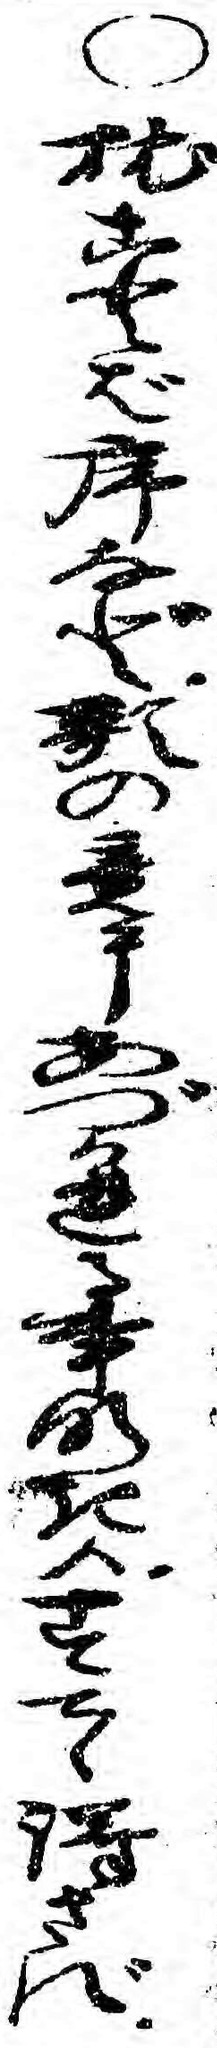◯枕ことば序など。歌の意にあづかれる事なきは。すてゝ訳さず。
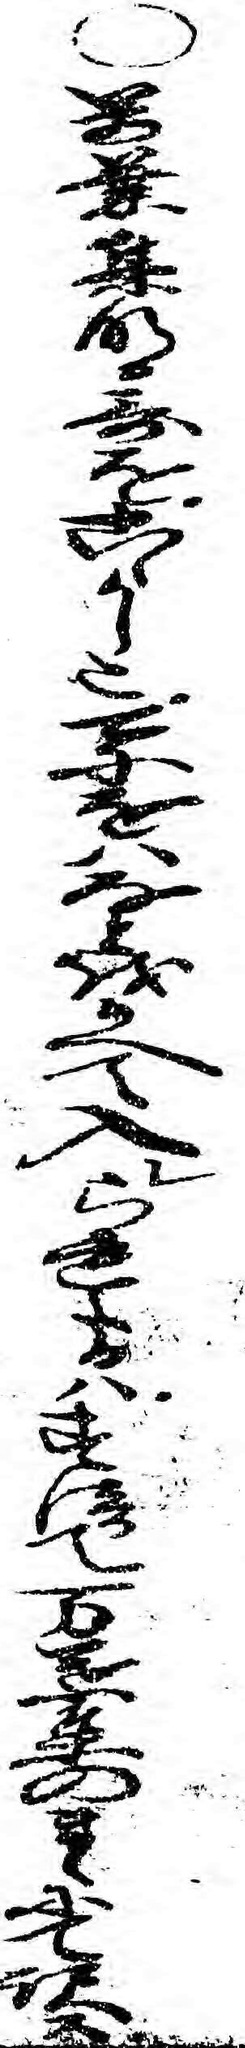◯万葉集なる哥をこゝかしこ。てふをはなとをかへて入れられたるは。すべて万葉集のまゝにて訳す。
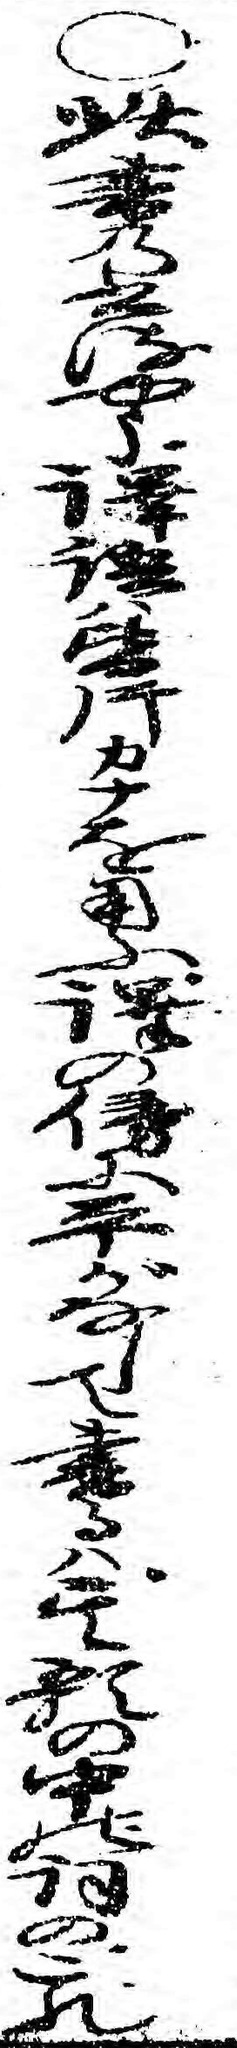◯此書の書るやう。訳語は皆片カナを用ふ。訳の傍に平がなして書るは。其歌の中の詞の。これ
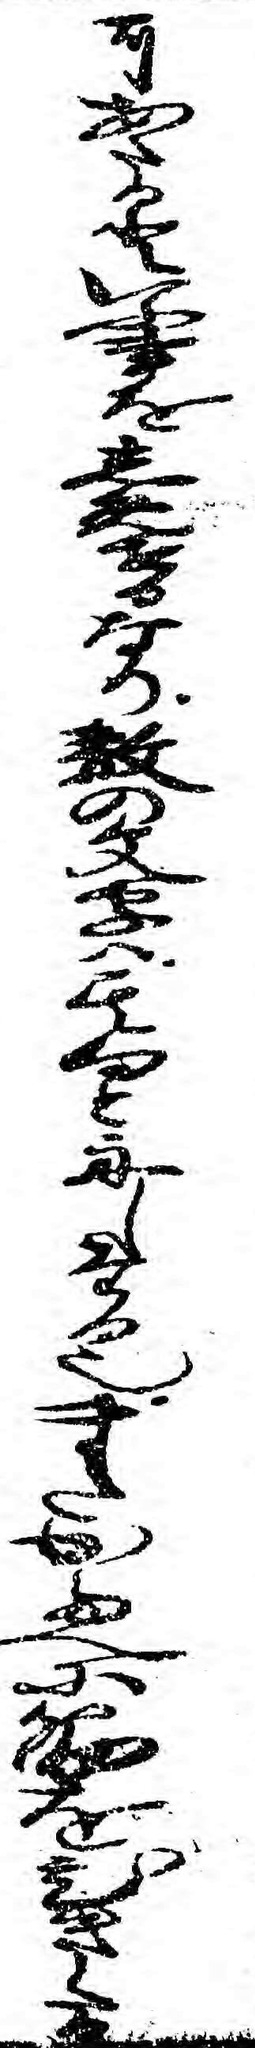にあたるといふ事をしめせるなり。数の文字は其句とにしたるなり。またかたへに筋をひきたる
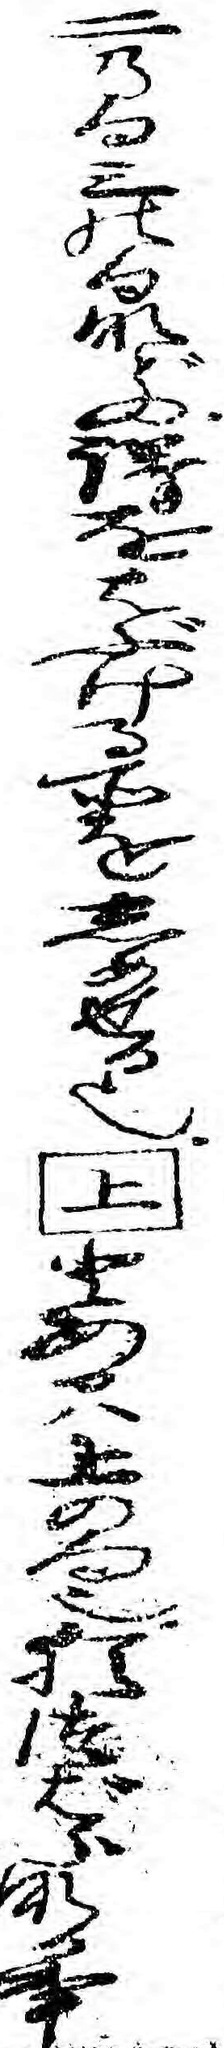二の句三の句などの。訳をはぶける所をしめせる也。上とあるは上の句也。猶つばらなる事
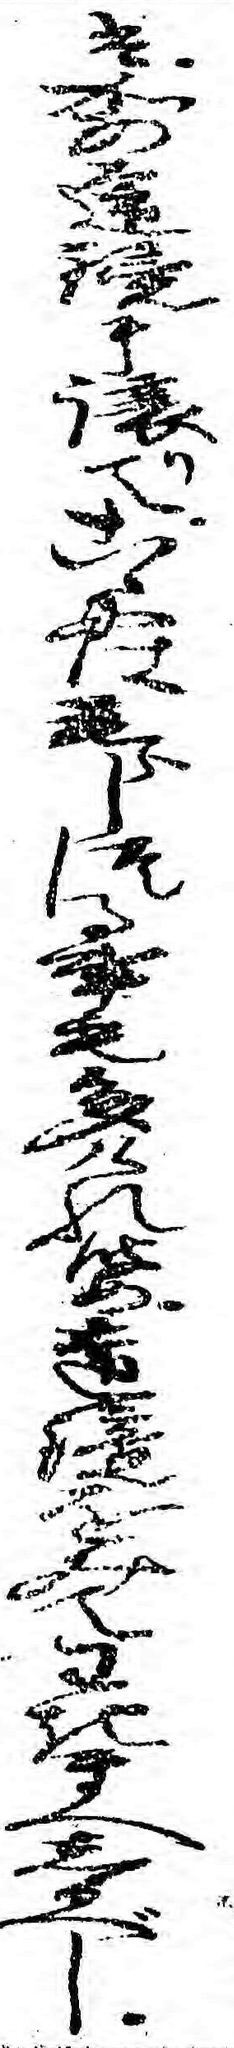は。かの遠鏡に譲りて。こゝにはもらしつる事も多ければ。遠鏡を見てわきまへしるべし。
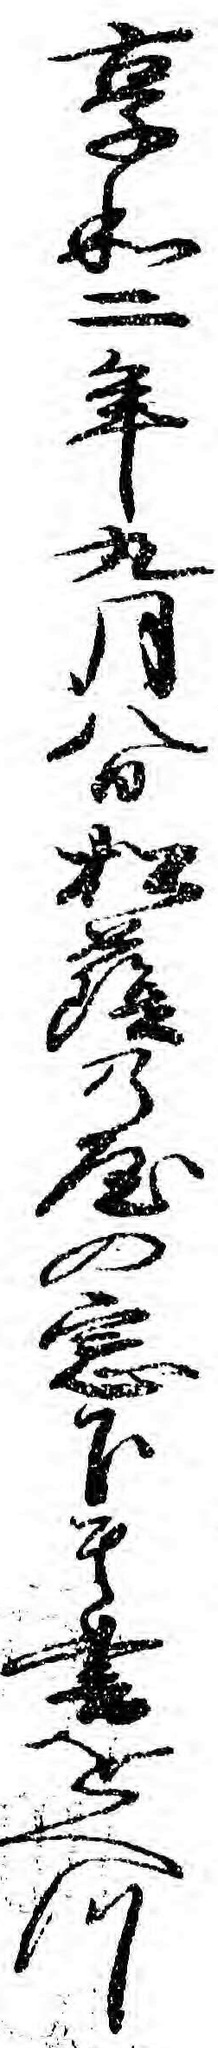享和二年九月八日松蔭の屋の窓下に書をへつ
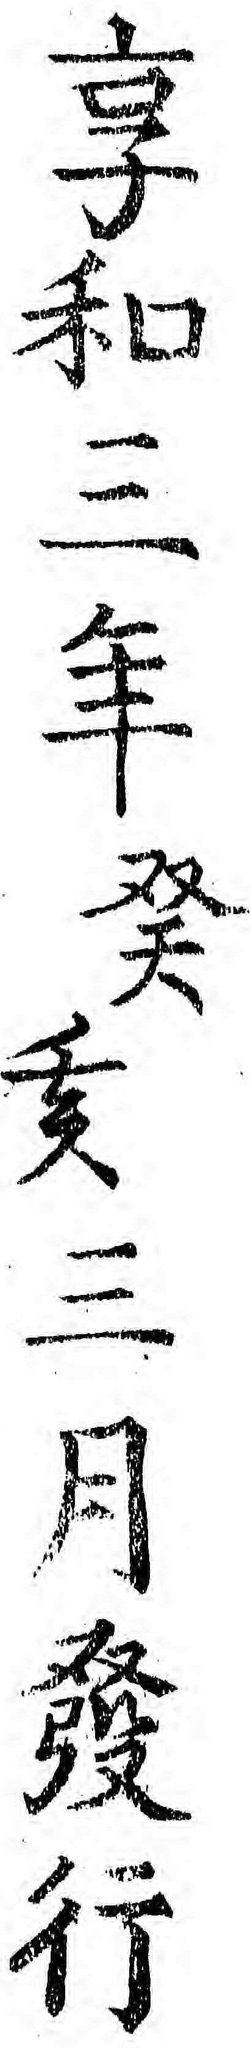享和三年癸亥三月発行
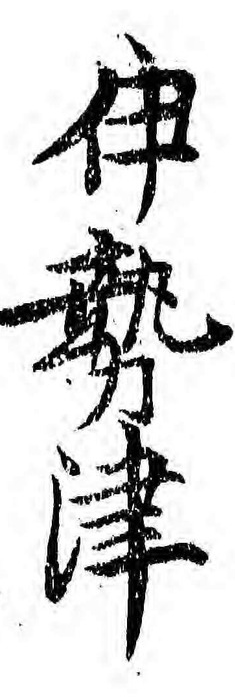伊勢津
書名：百人一首／小倉の山ふみ
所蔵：国文学研究資料館
